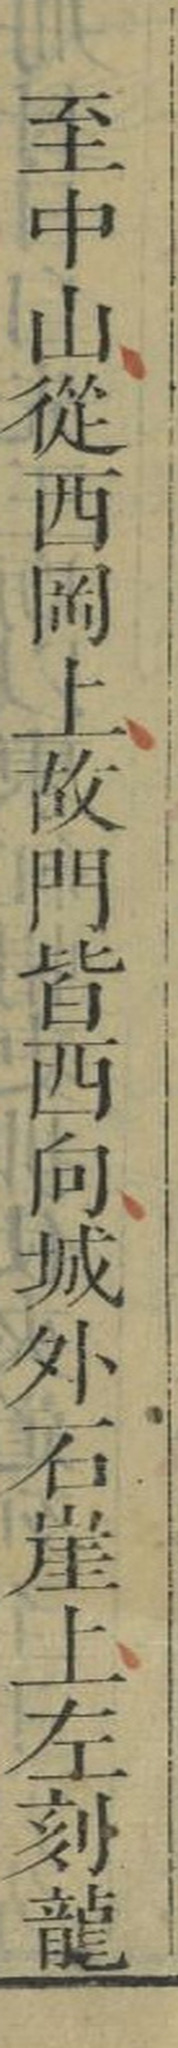至中山從西岡上故門皆西向城外石崖上左刻龍
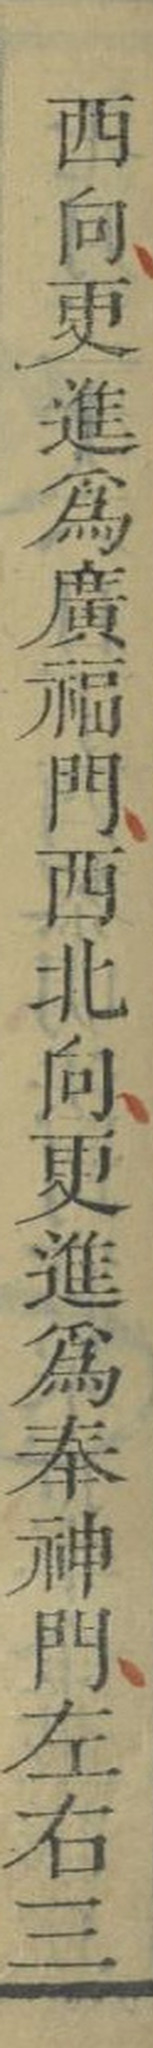西向更進爲廣福門西北向更進爲奉神門左右三
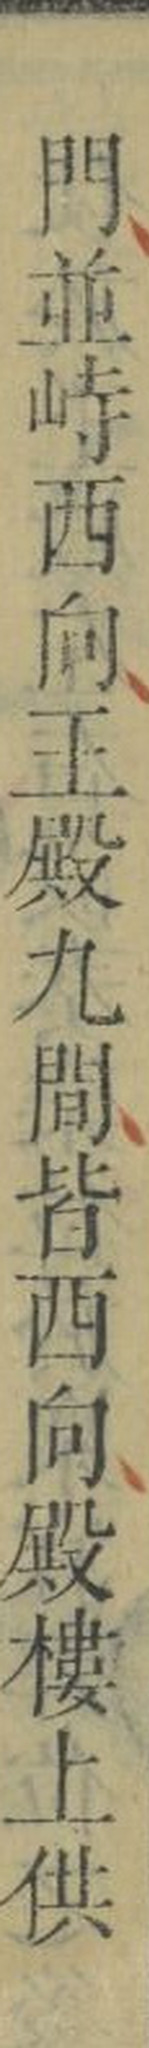門並峙西向王殿九間皆向殿樓上供
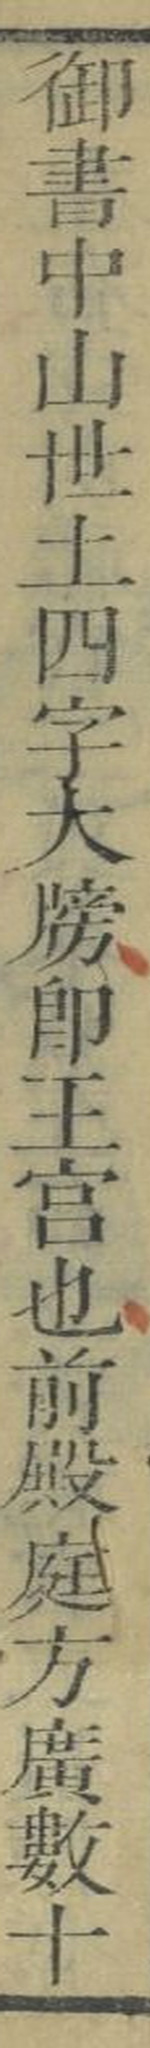御書中山世土四字大牓卽王宫也前殿庭方廣數十
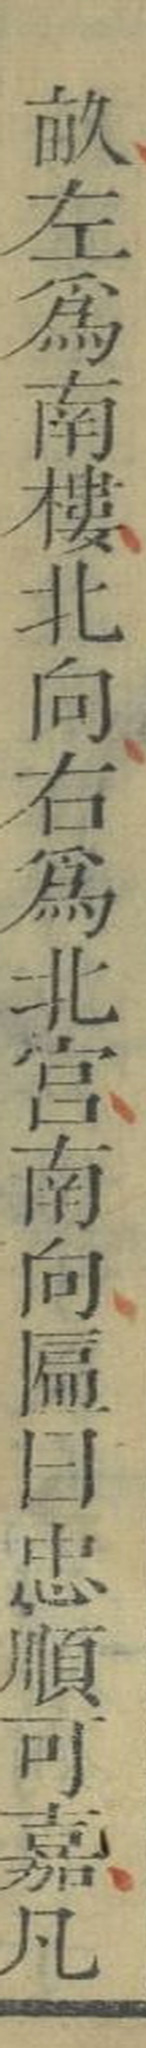畝左爲南樓北向右爲北宫南向匾曰忠順可嘉凡
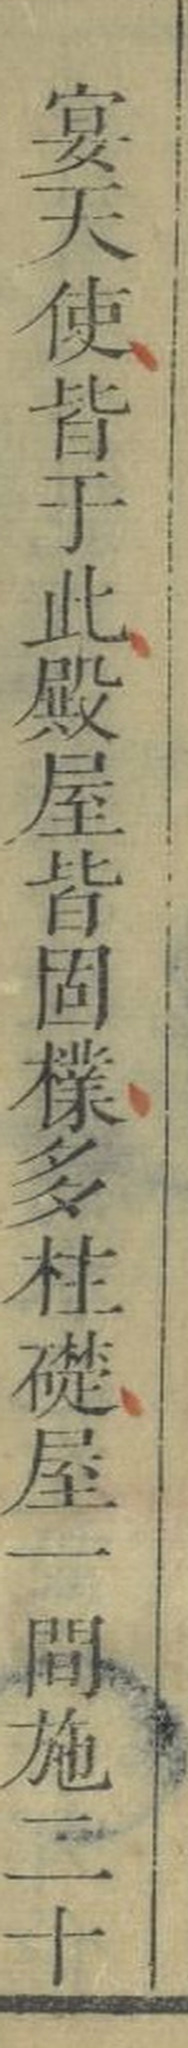宴天使皆于此殿屋皆固檏多柱礎屋一間施二十
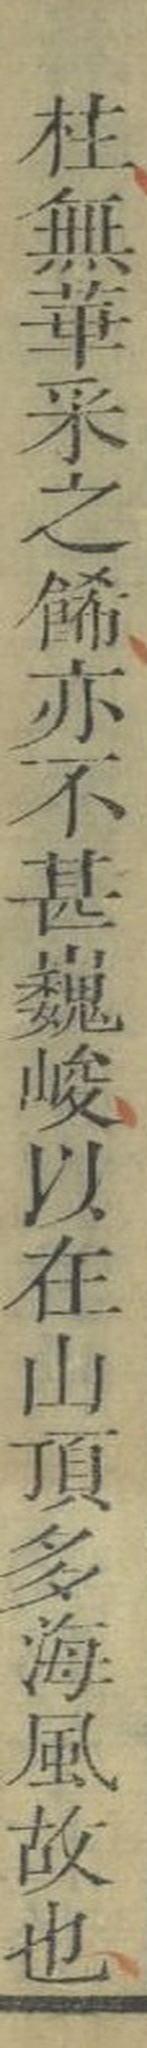柱無華采之餙亦不甚巍峻以在山頂多海風故也
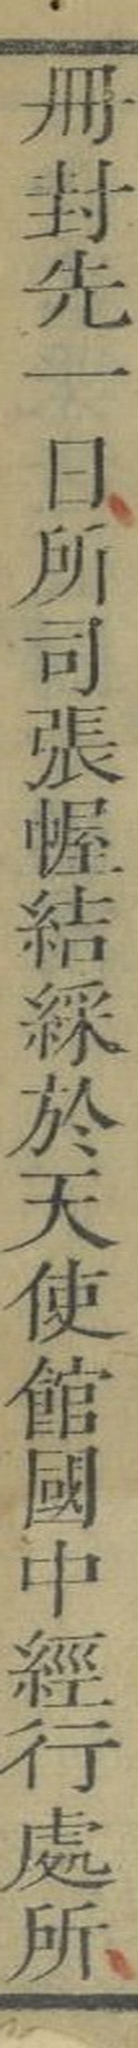冊封先一日所司張幄結綵於天使館國中經行處所

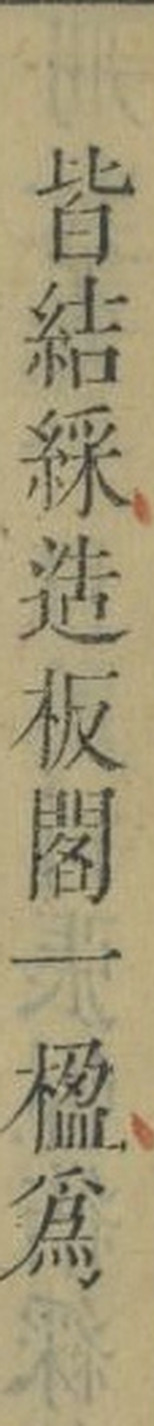皆結綵造板閣一楹爲
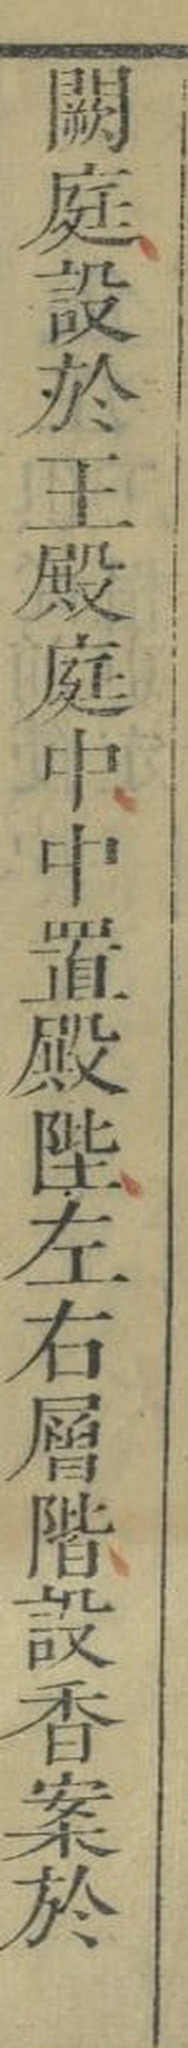闕庭設於王殿庭中中置殿陛左右層階設香案於
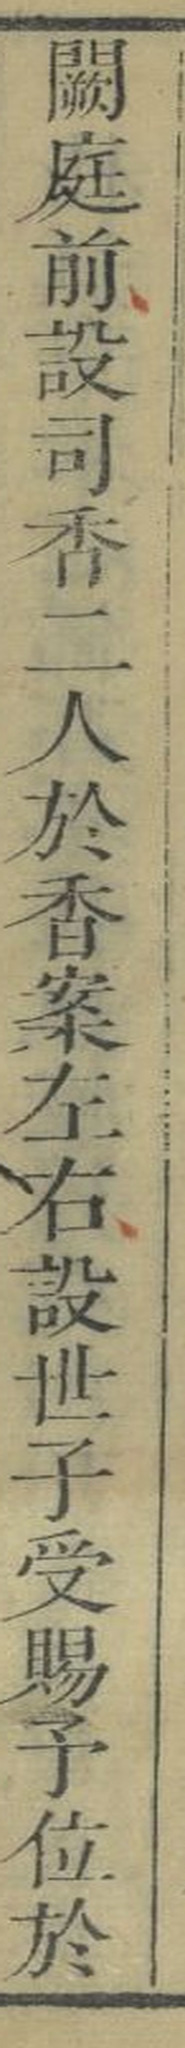闕庭前設司香二人於香案左右設世子受賜予位於
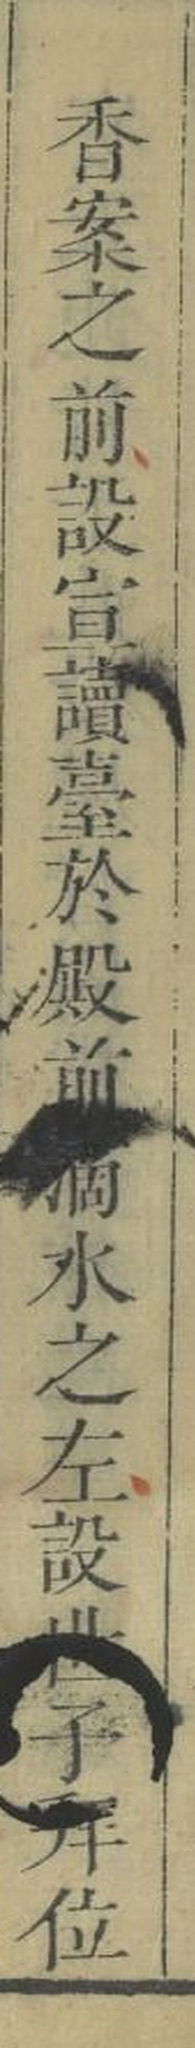香案之前設宣讀臺於殿前滴水之左設世子拜位
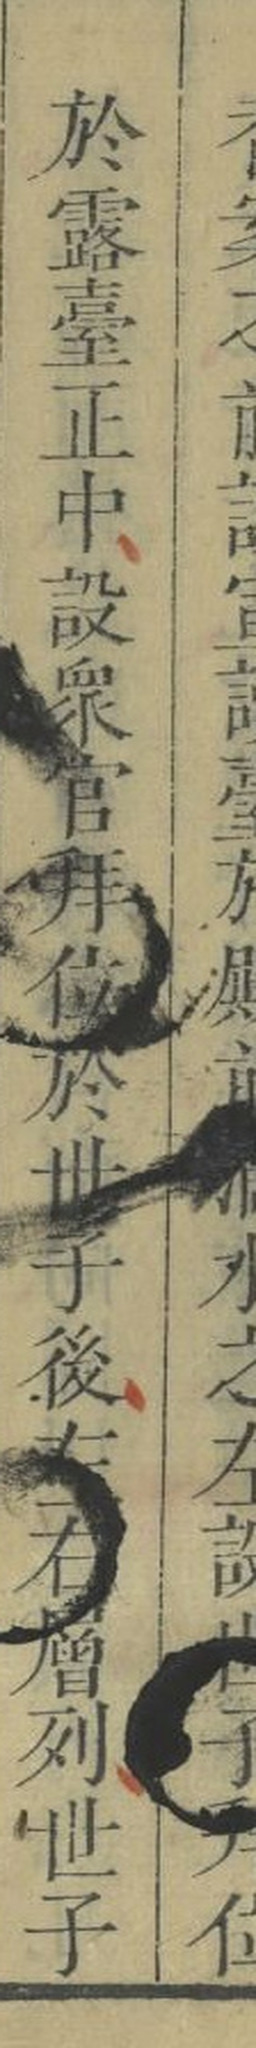於露臺正中設衆官拜位於世子後左右層列世子
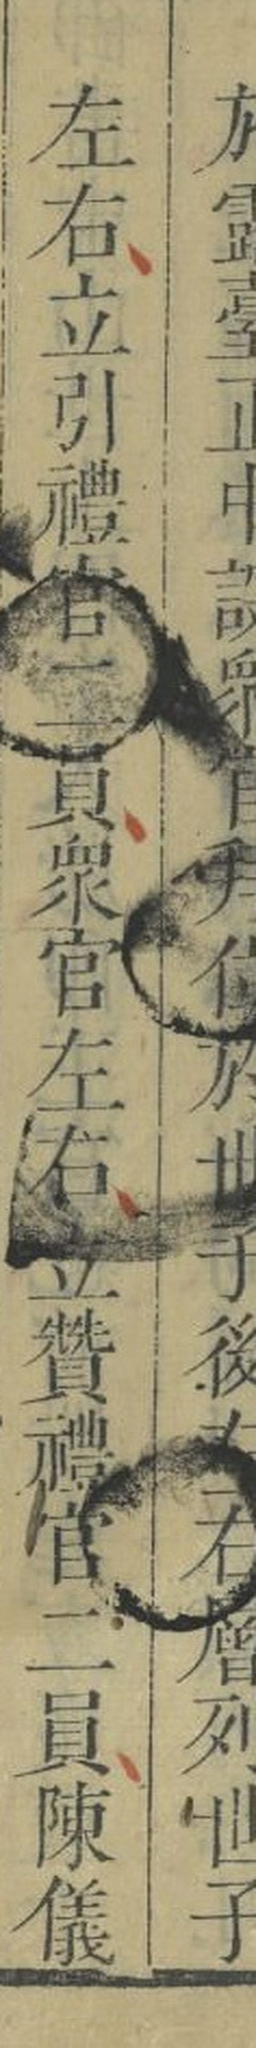左右立引禮官二員衆官左右立贊禮官二員陳儀
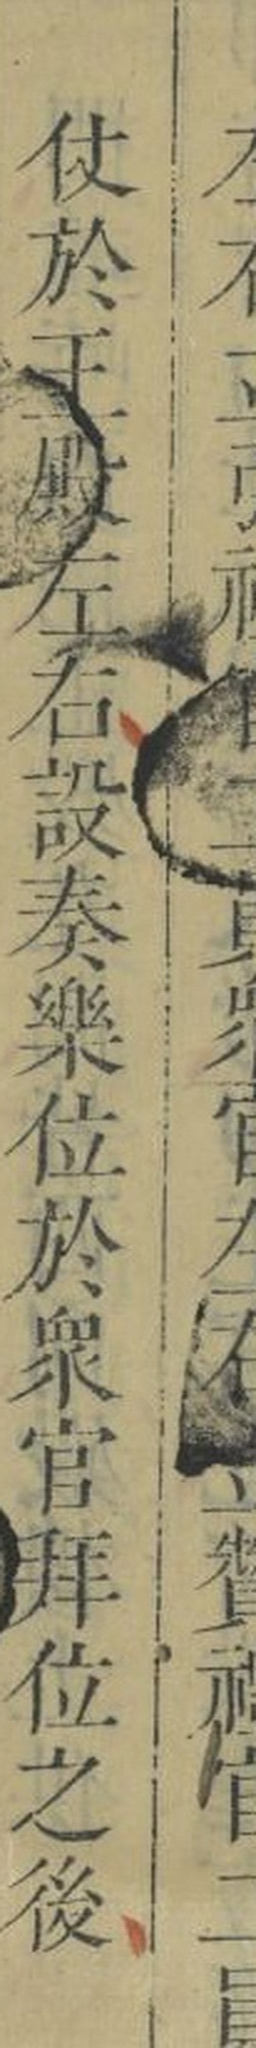仗於王殿左右設奏樂位於衆官拜位之後
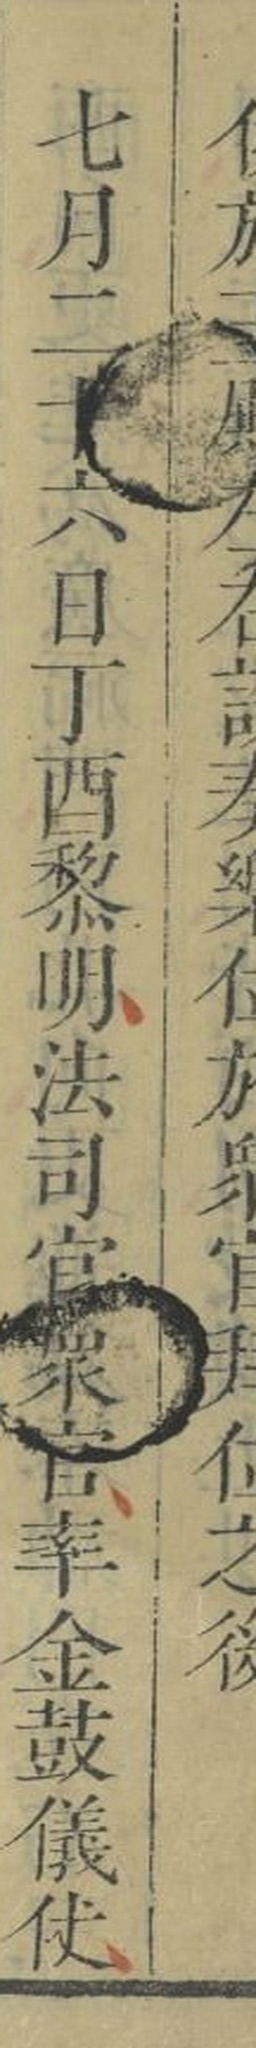七月二十六日丁酉黎明法司官衆官率金鼓儀仗
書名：中山伝信録 巻一、巻二
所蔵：University of the Ryukyus Library
